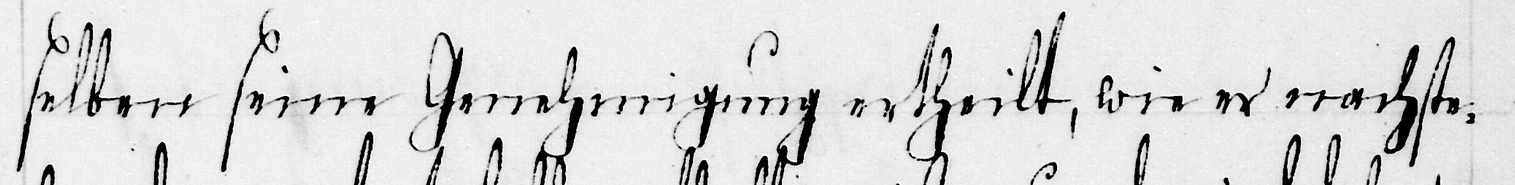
selben seine Genehmigung ertheilt, wie er nachste¬
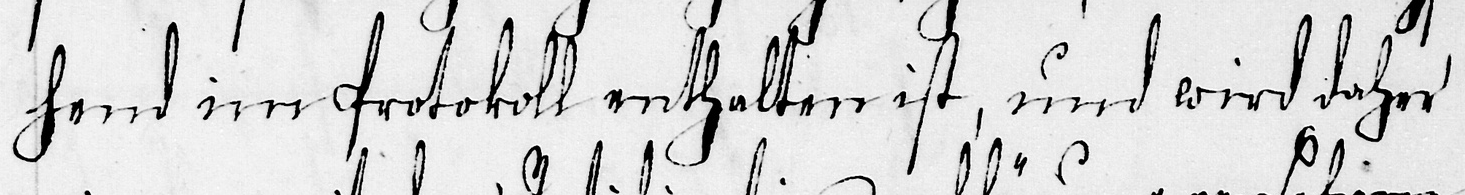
hend im Protokoll enthalten ist, und wird daher
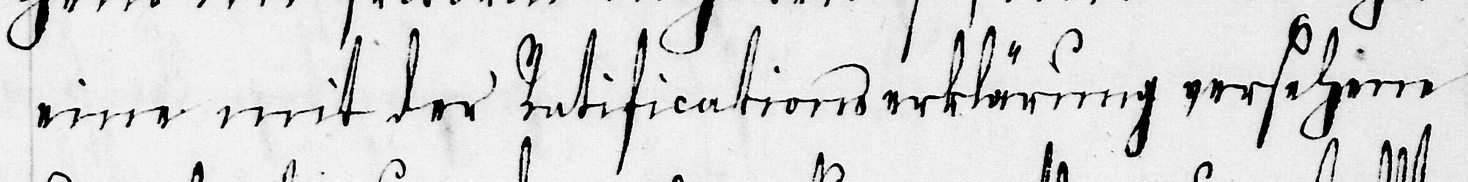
eine mit der Ratificationserklärung versehene
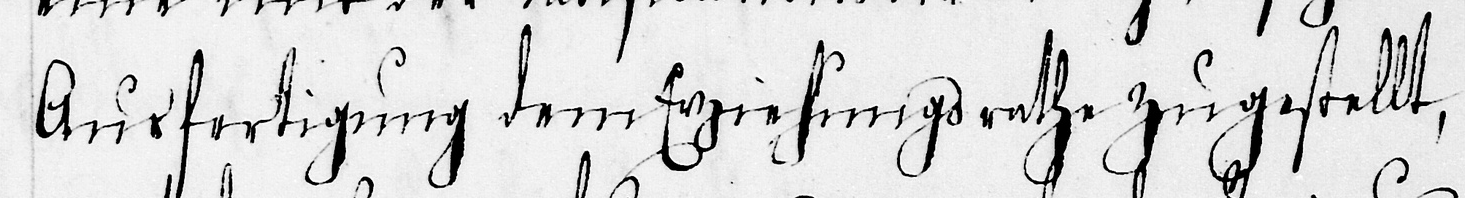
Ausfertigung dem Erziehungsrathe zugestellt,
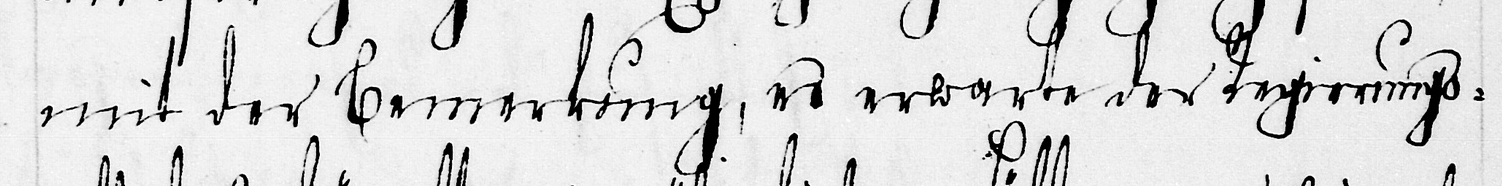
mit der Bemerkung, es erwarte der Regierungs¬
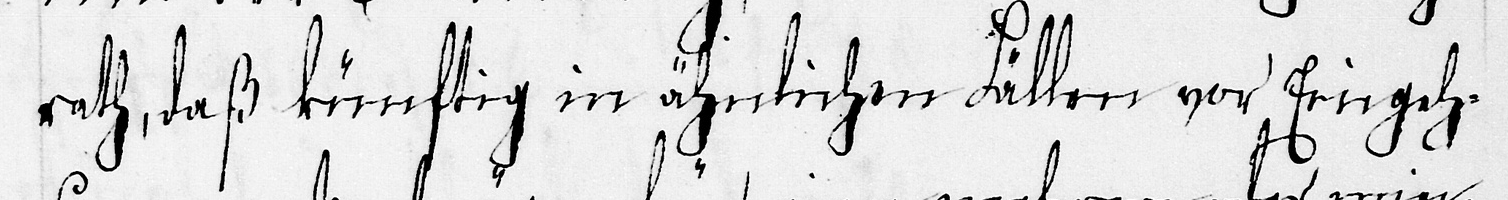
rath, daß künftig in ähnlichen Fällen vor Eingeh¬
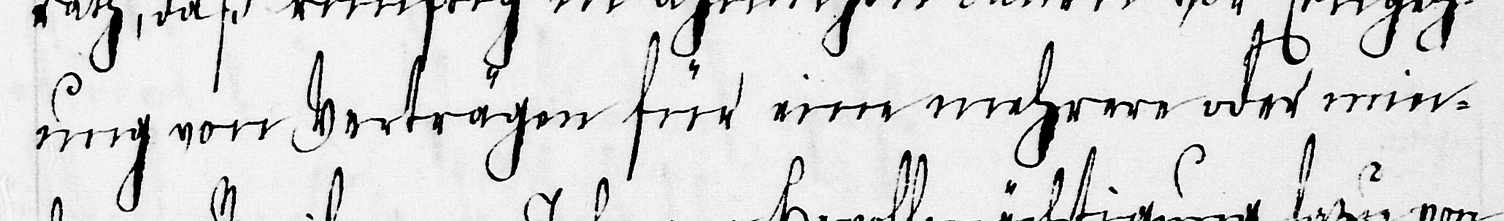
ung von Verträgen für eine mehrere oder min¬
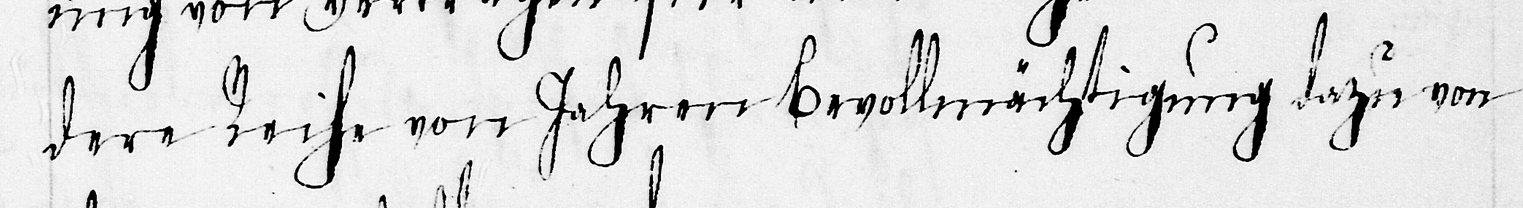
dere Reihe von Jahren Bevollmächtigung dazu von
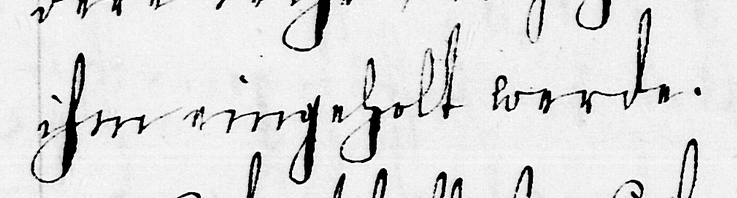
ihm eingeholt werde.
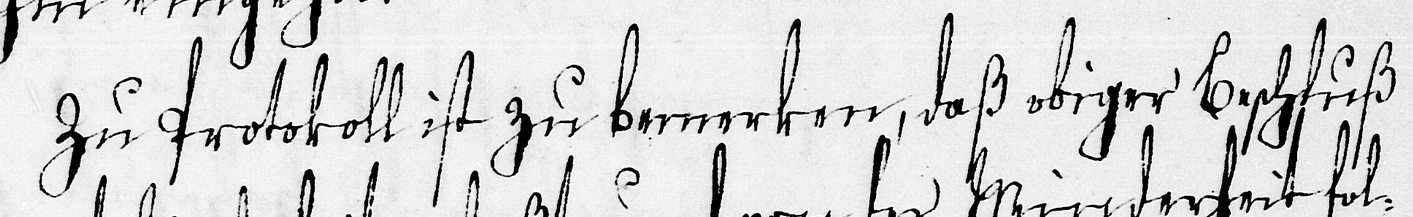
Zu Protokoll ist zu bemerken, daß obiger Beschluß
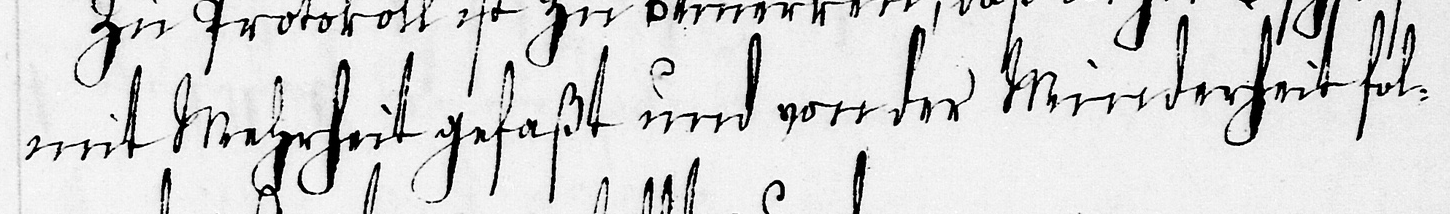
mit Mehrheit gefaßt und von der Minderheit fol¬
